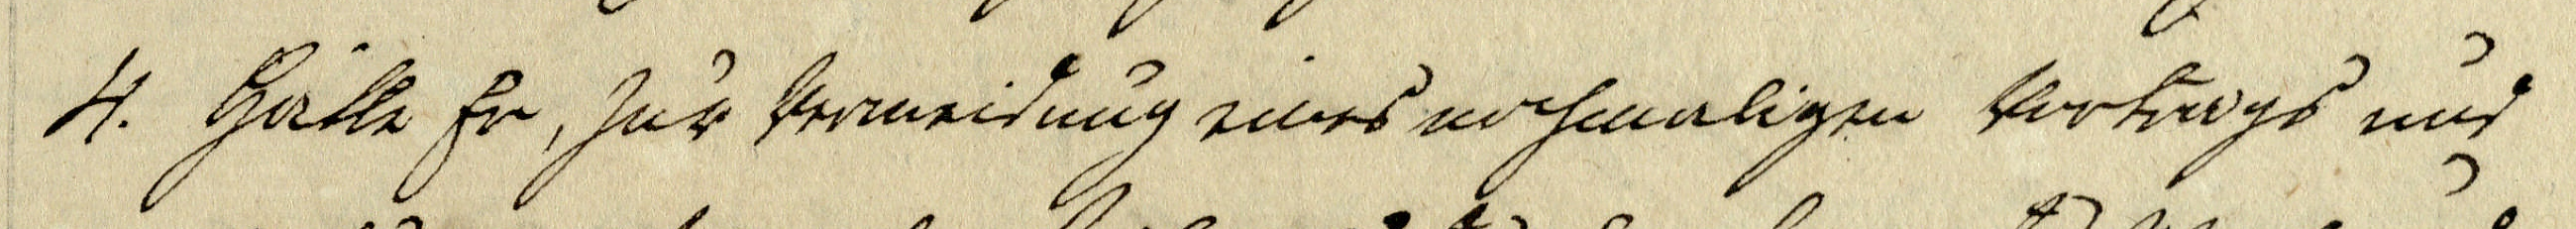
4. Hätte Er, zur Vermeidung eines nochmaligen Vortrags und
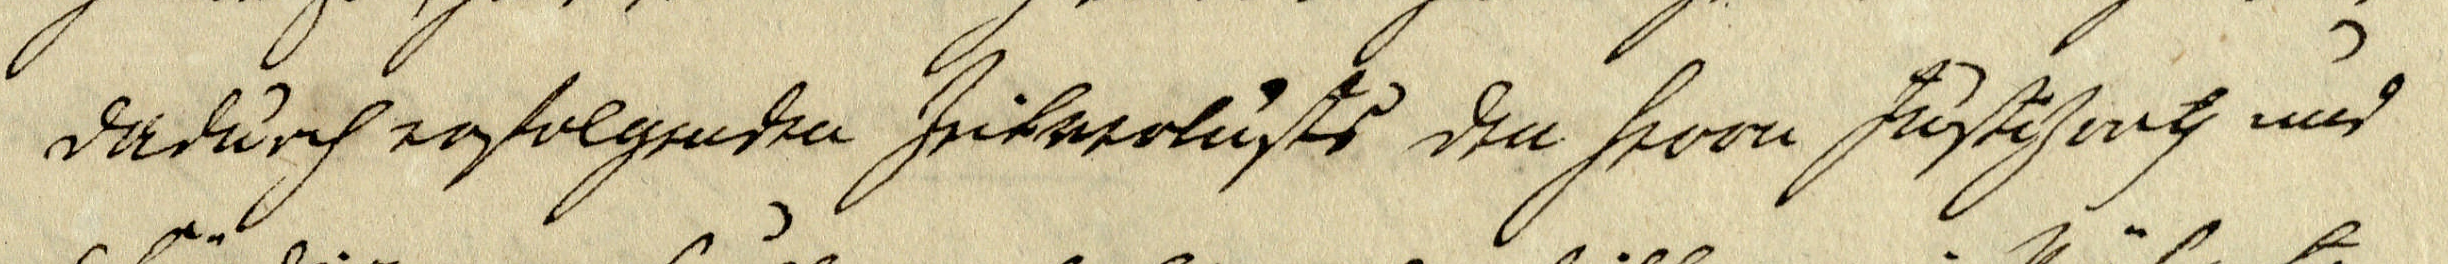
dadurch erfolgenden Zeitverlusts den Herrn Justizrath und
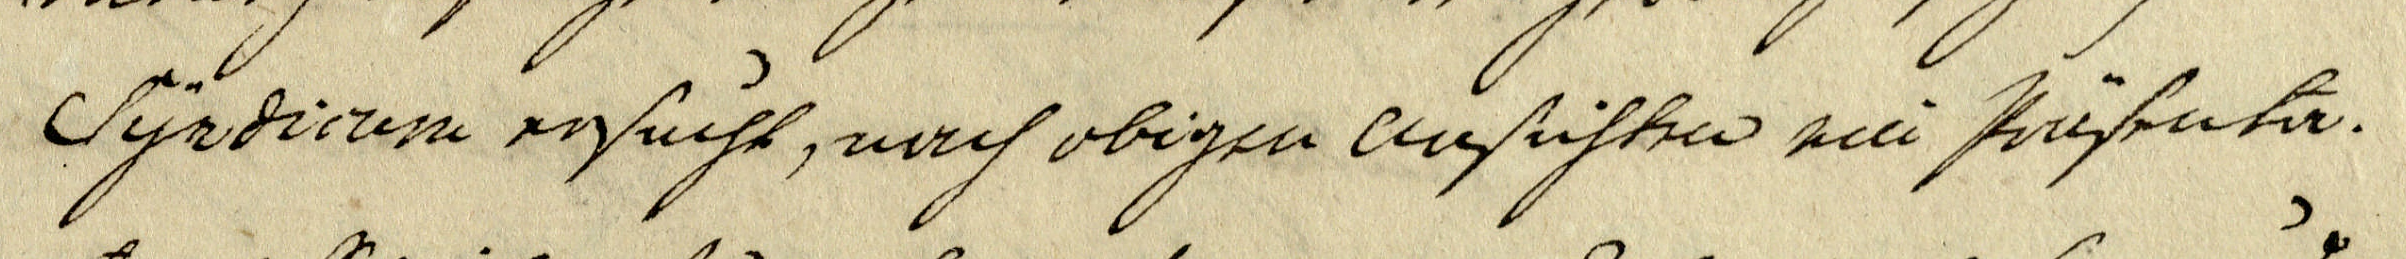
Sÿndicum ersucht, nach obigen Ansichten ein Präsenta¬
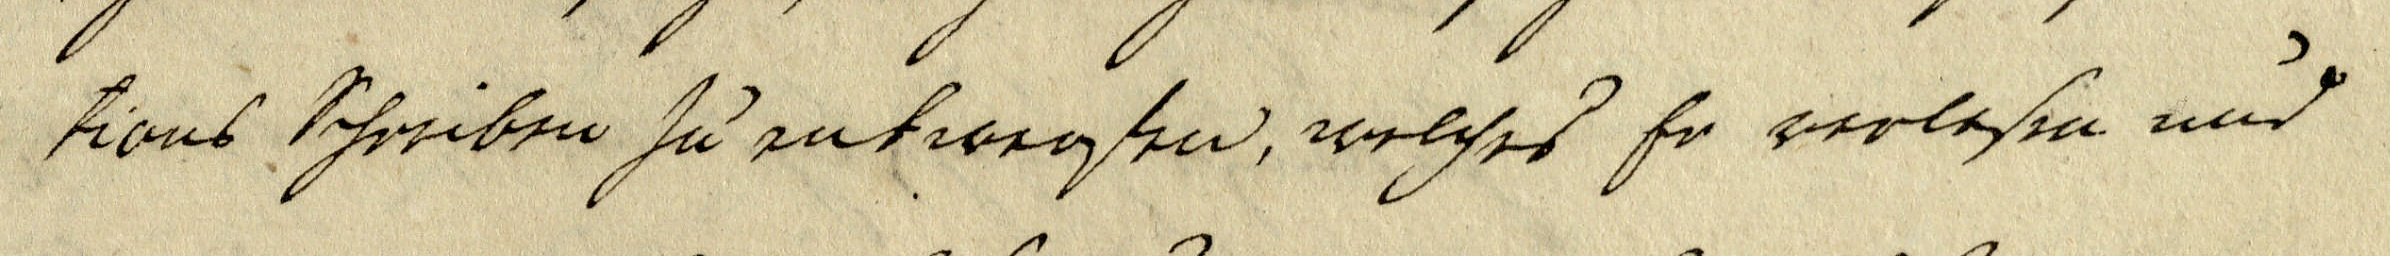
tions Schreiben zu entwerfen, welches Er verlesen und
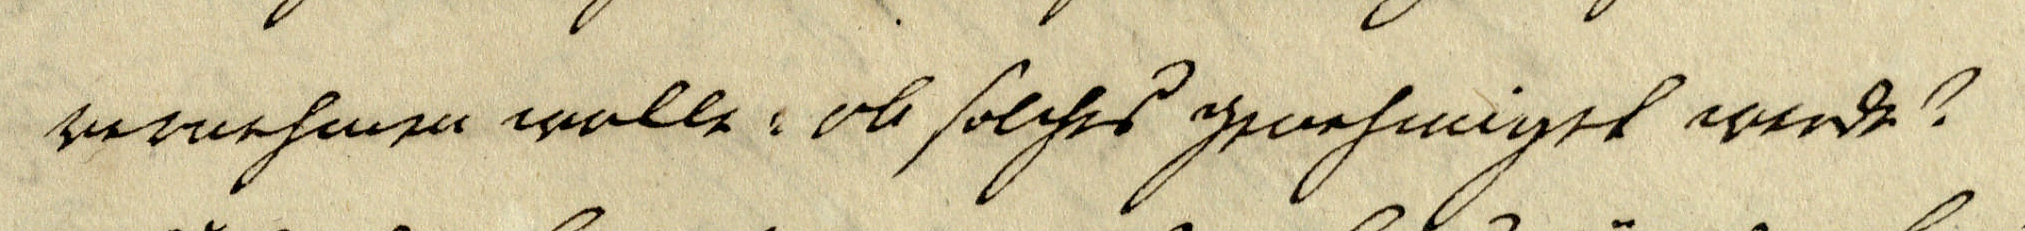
vernehmen wolle: ob solches genehmiget werde?
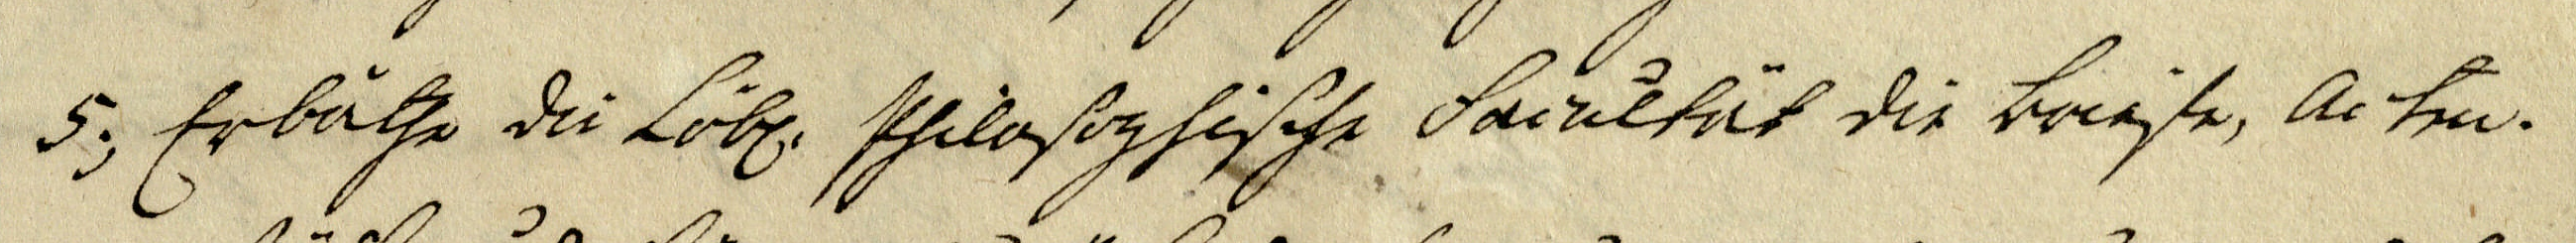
5., Erbäthe die Löbl. Philosophische Facultät die Briefe, Acten¬
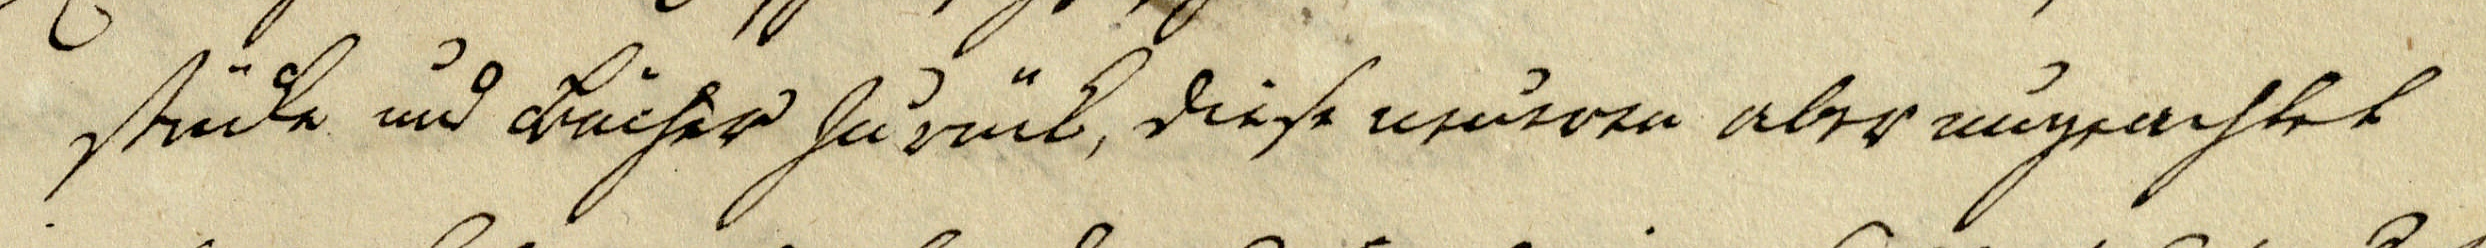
stücke und Bücher zurück, diese neueren aber ungeachtet
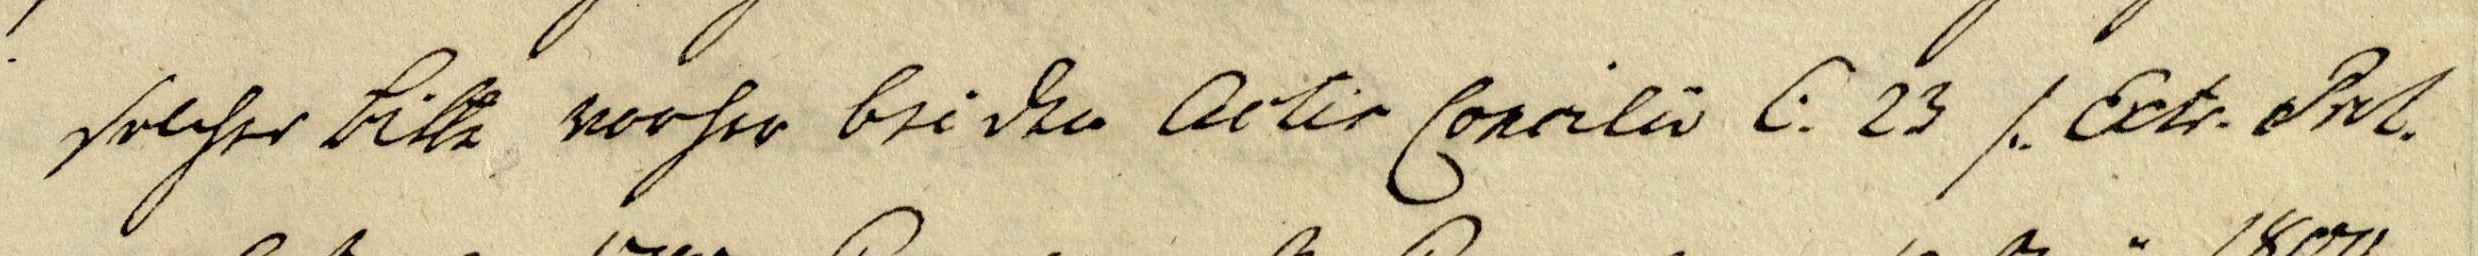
solcher Bitte vorher bei den Actis Concilii C. 23 /. Extr. Prot.
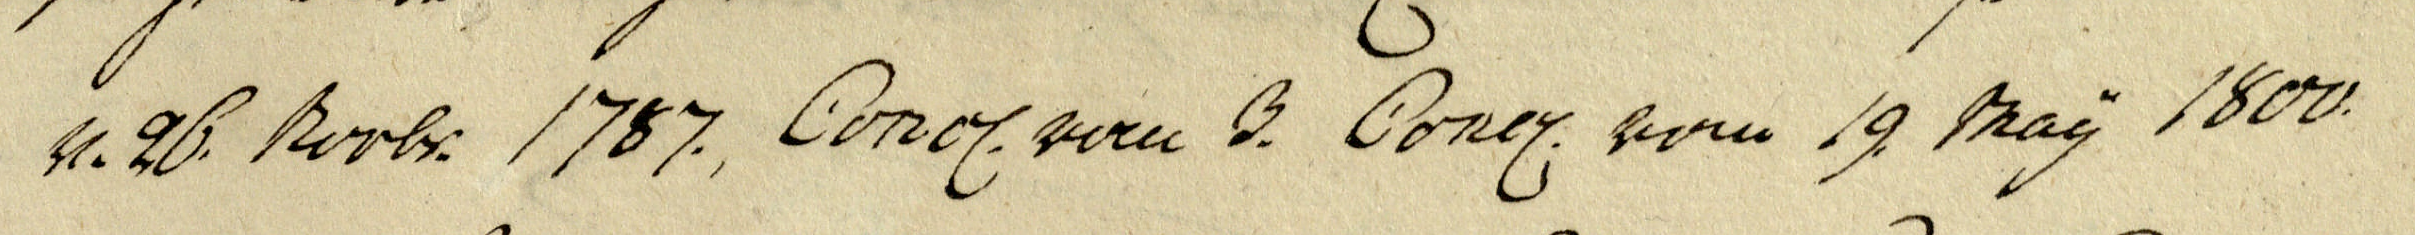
v. 26. Novbr. 1787. Concl. vom 3. Concl. vom 19. Maÿ 1800.
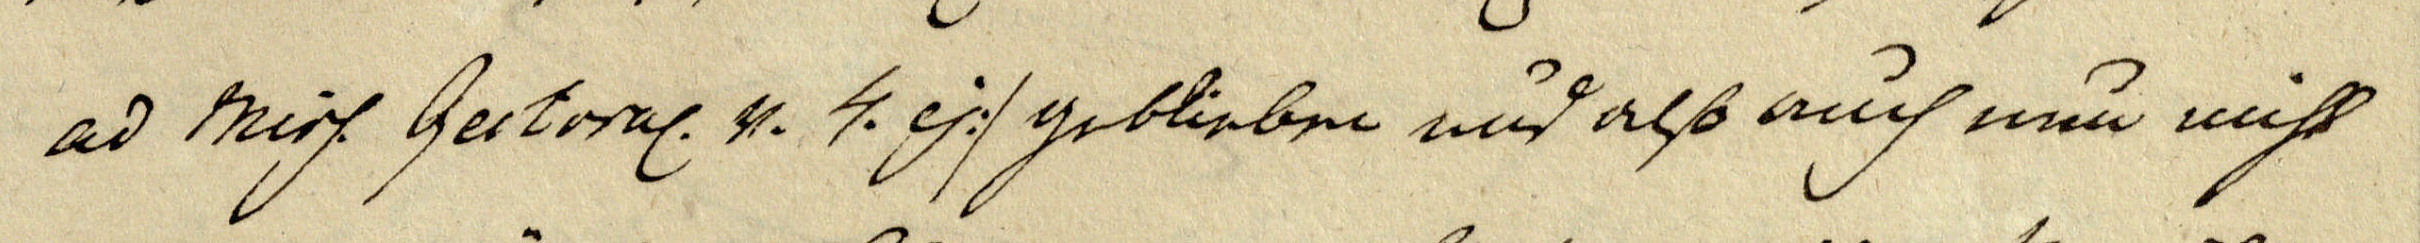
ad Miss. Rectoral. v. 4. ej :/ geblieben und also auch nun nicht
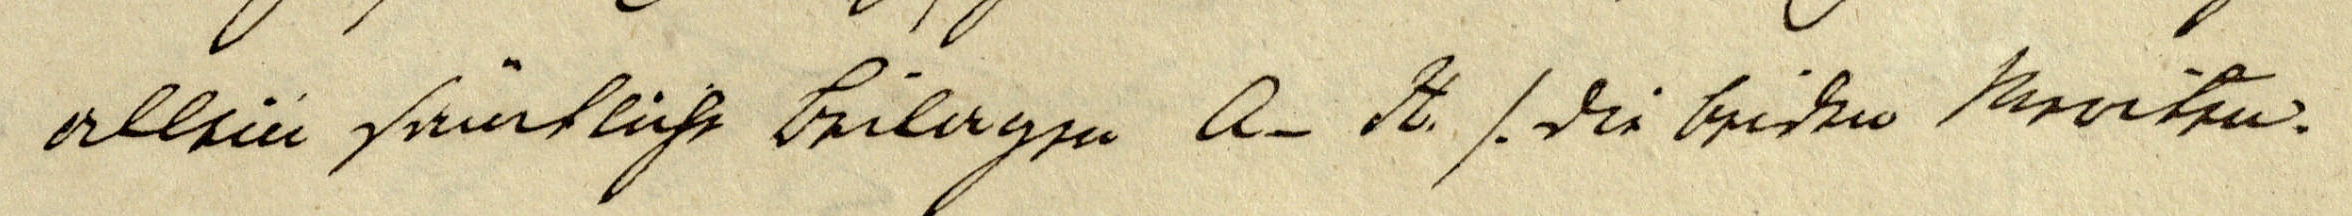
allein sämtliche Beilagen A -H /. die beiden Meriten¬
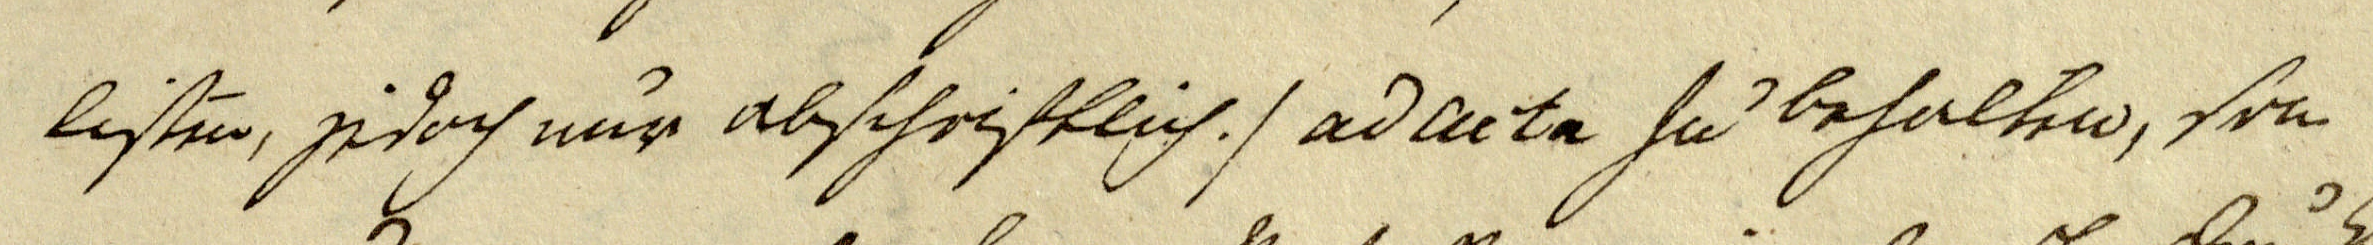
listen, jedoch nur abschriftlich ./ ad Acta zu behalten, son¬
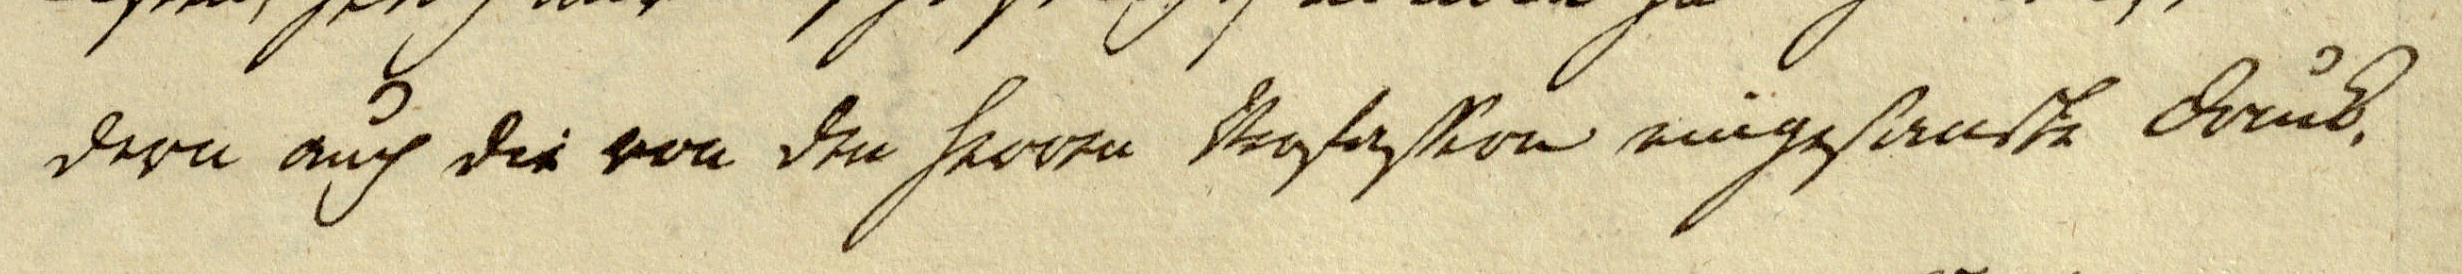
dern auch die von den Herren Verfassern eingesandte Druck¬
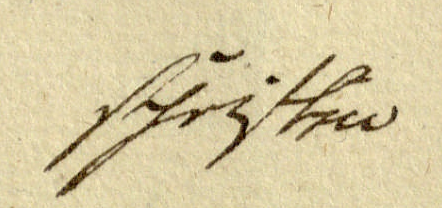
schriften
